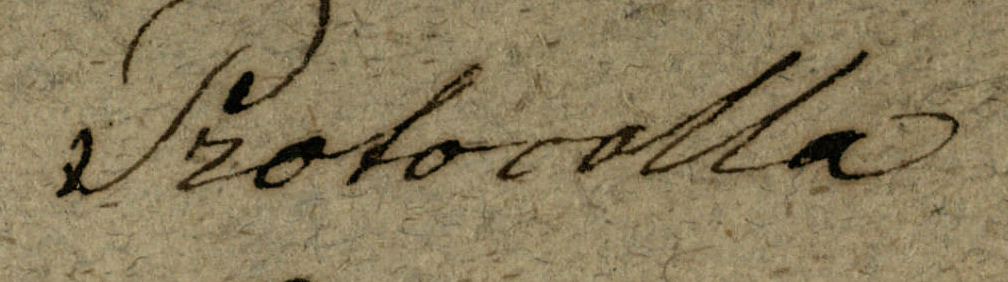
Protocolla
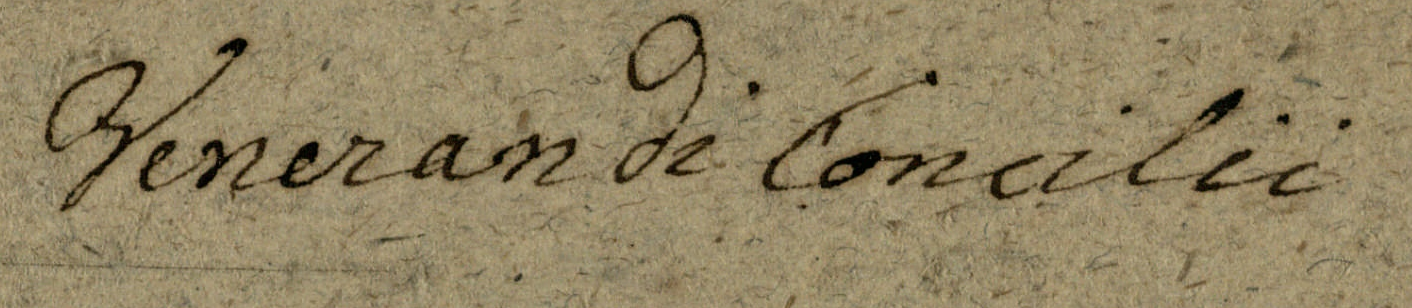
Venerandi Concilii
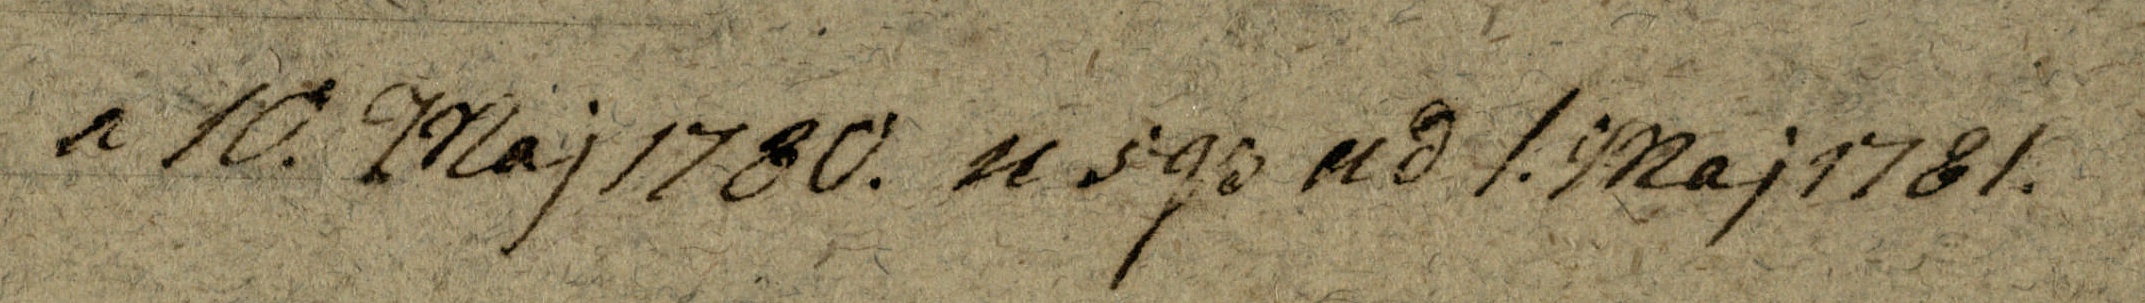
a 10. Maj 1780. usqe ad 1. Maj 1781.
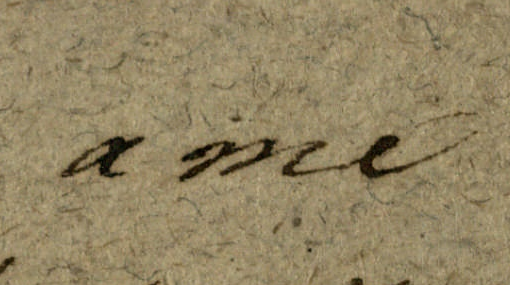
a me
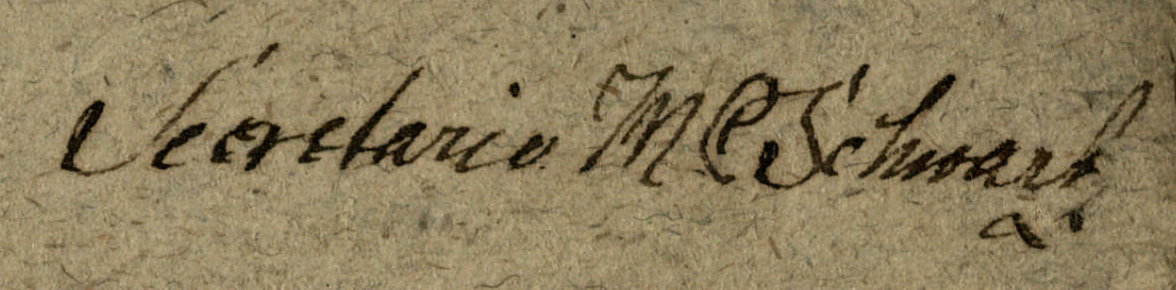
Secretario M. Schwartz
